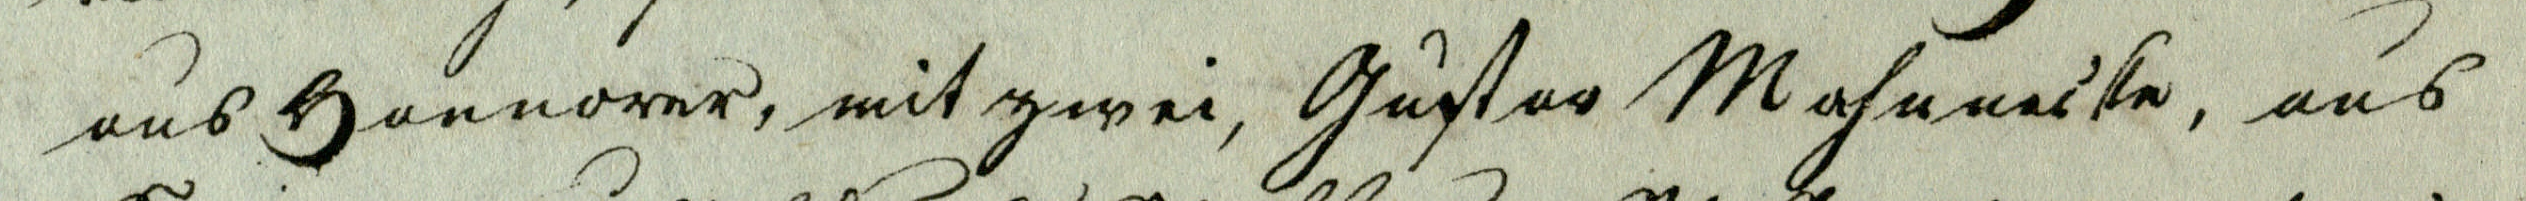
aus Hannover, mit zwei, Gustav Mohnnecke, aus
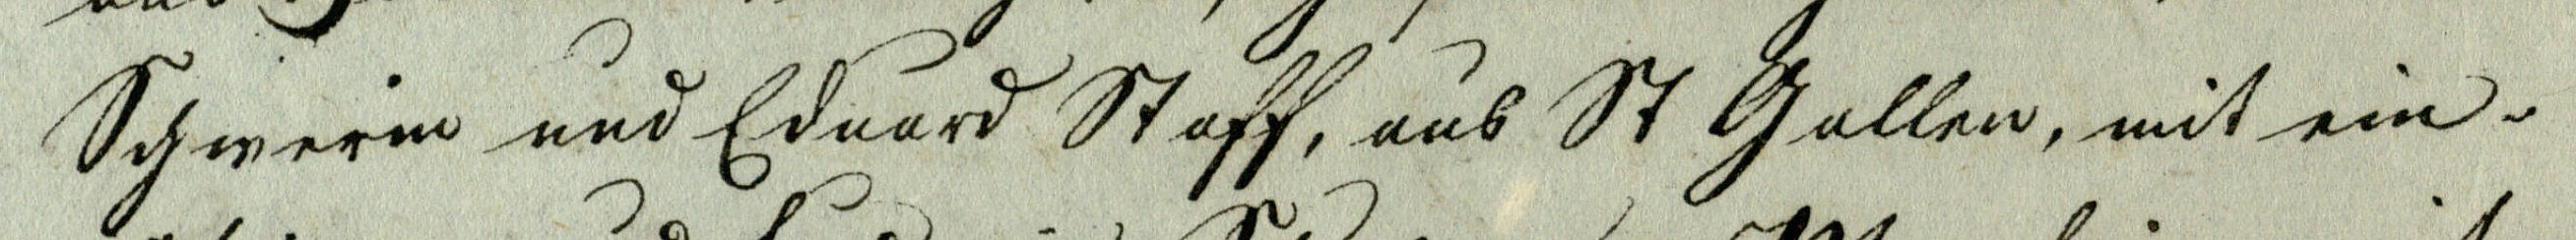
Schwerin und Eduard Staff, aus St Gallen, mit ein¬
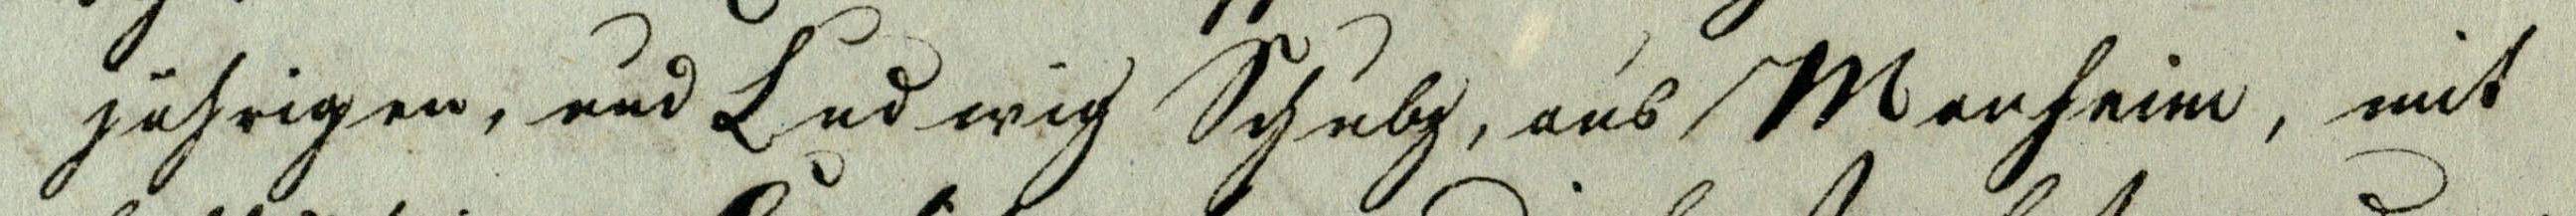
jährigen, und Ludwig Schulz, aus Manheim, mit
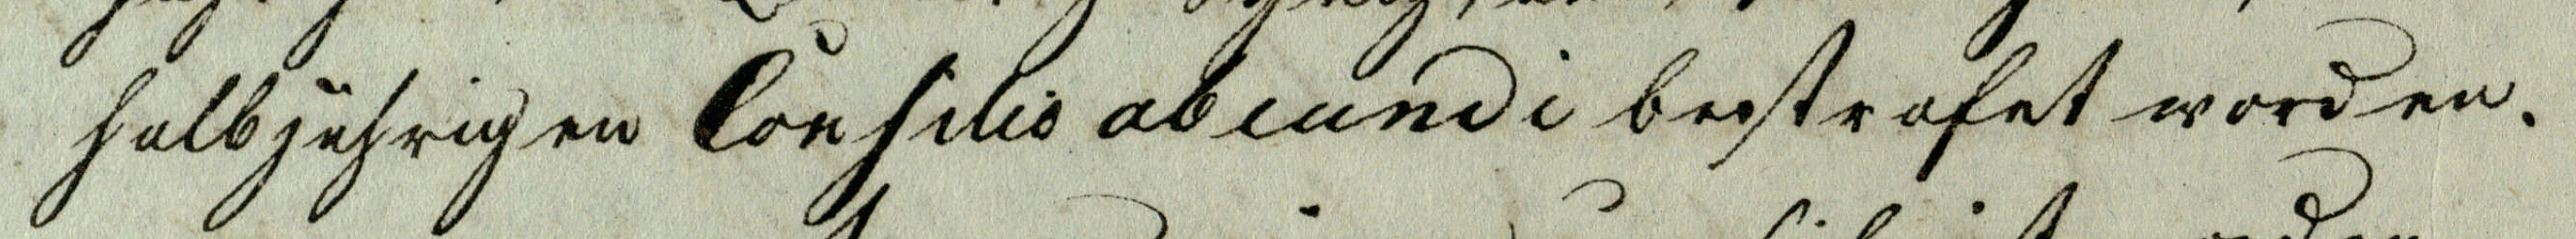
halbjährigen Consilio abeundi bestrafet worden.
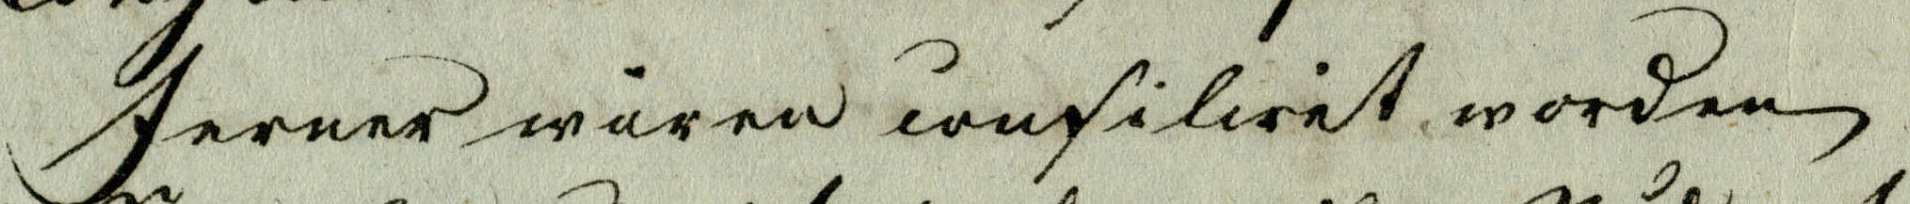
Ferner wären consiliret worden
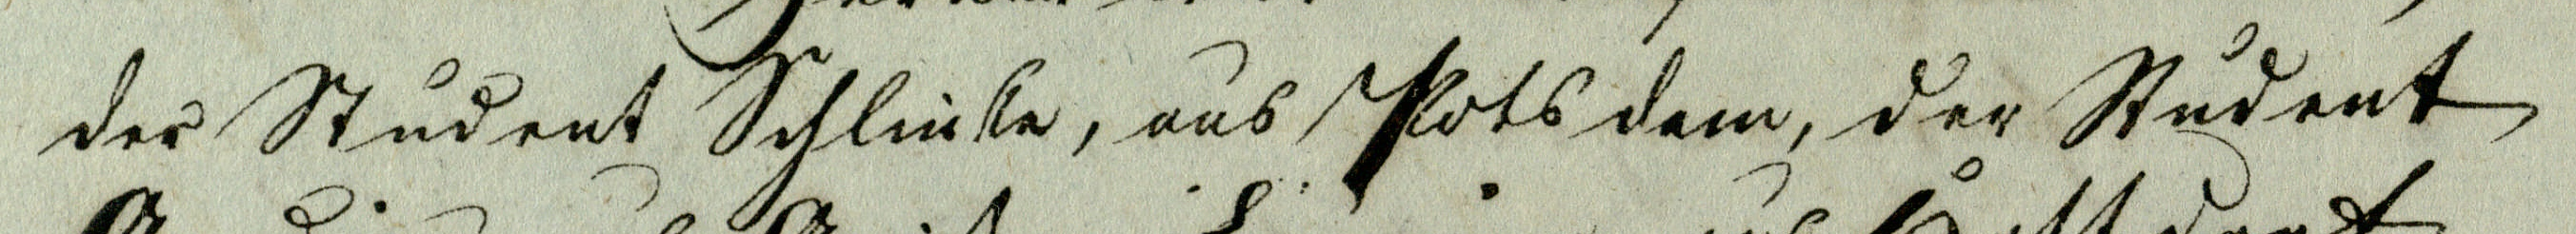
der Student Schlinke, aus Potsdam, der Student
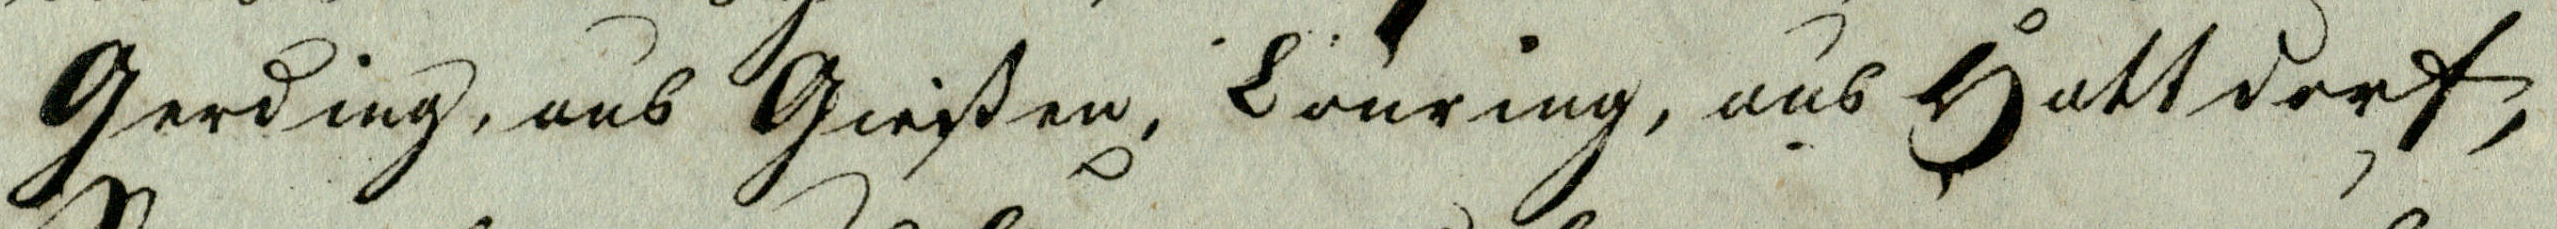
Gerding aus Gießen, Conring aus Hattdorf,
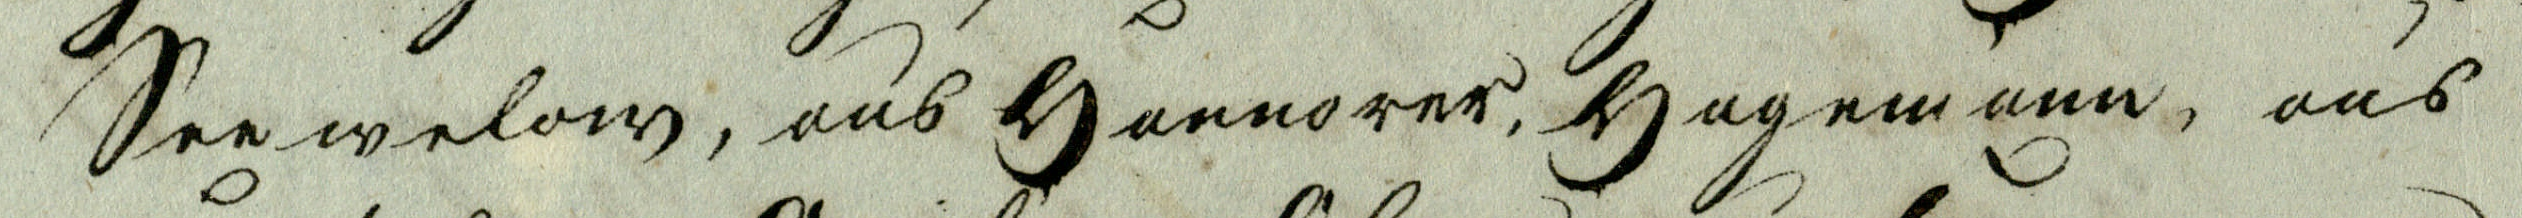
Seewelow, aus Hannover, Hagemann, aus
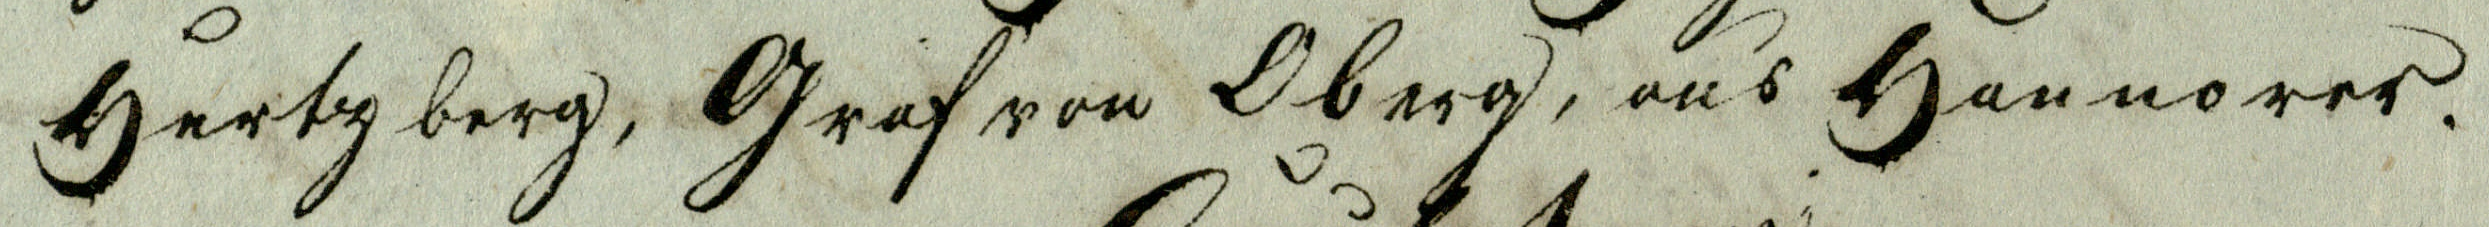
Hertzberg, Graf von Oberg, aus Hannover.
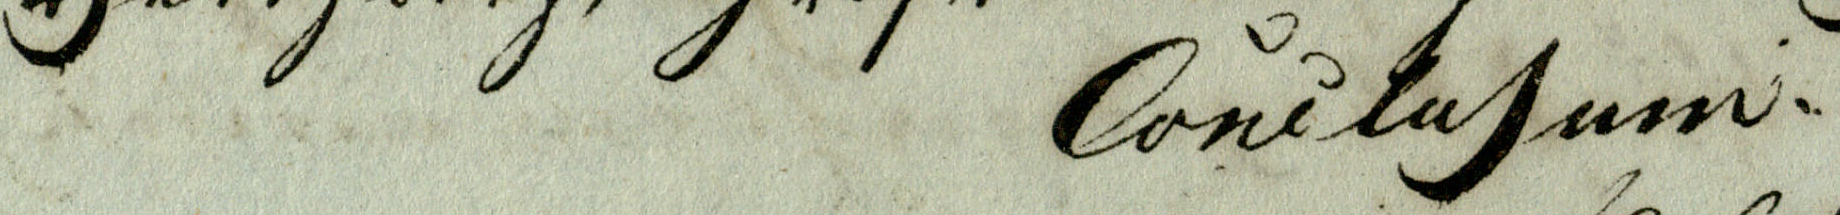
Conclusum:
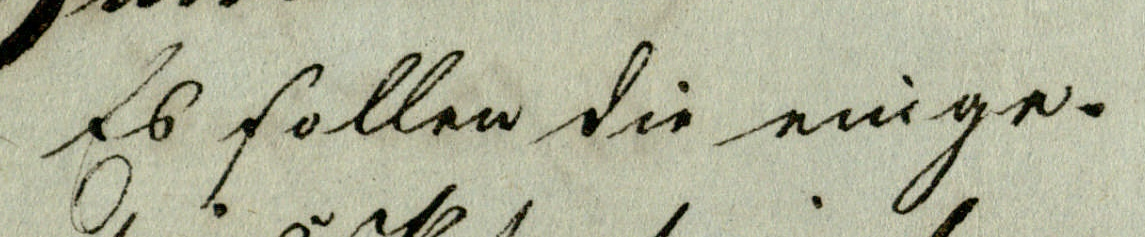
Es sollen die einge¬
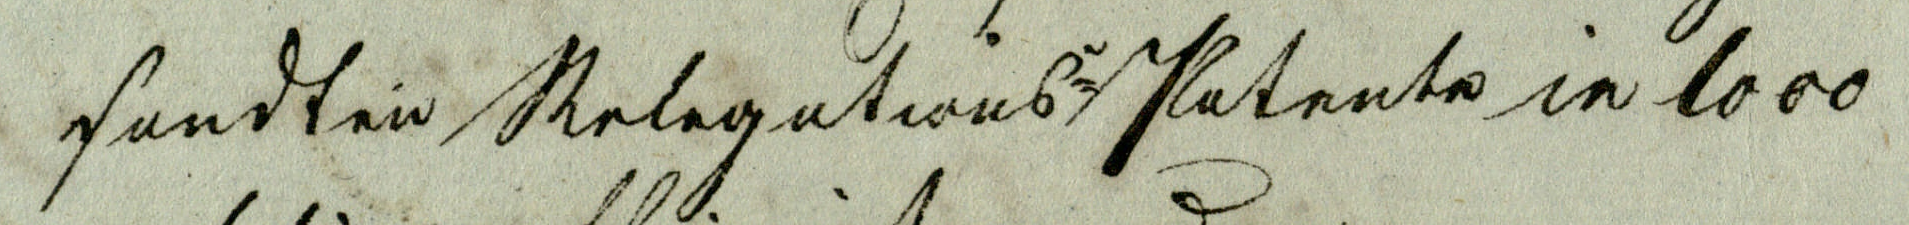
sandten Relegations Patente in loco
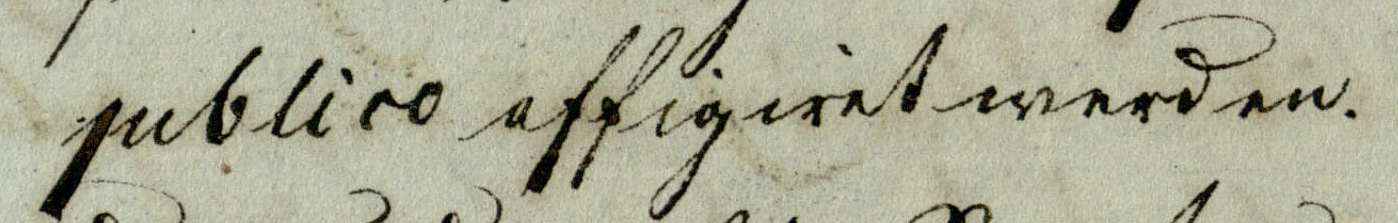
publico affigiret werden.
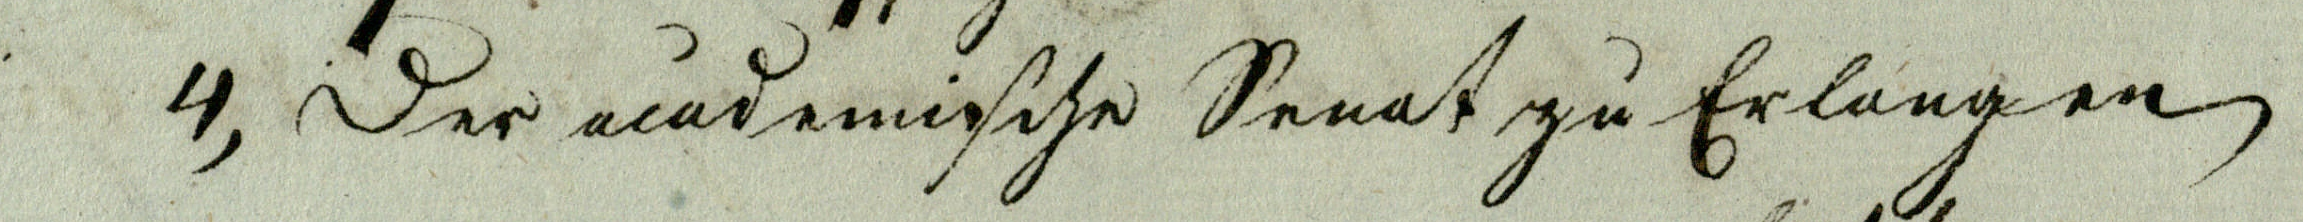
4, Der academische Senat zu Erlangen
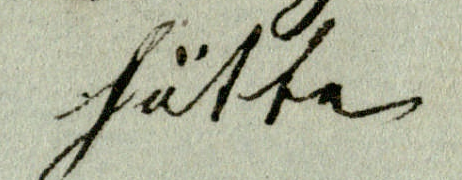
hätte
